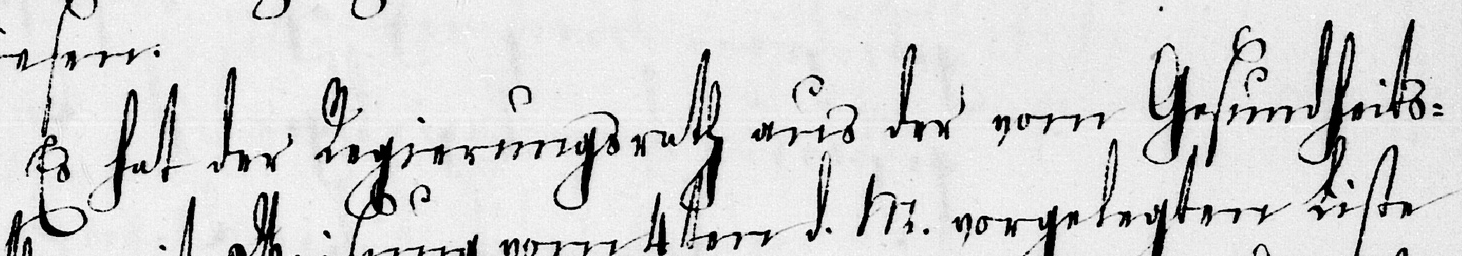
Es hat der Regierungsrath aus der vom Gesundheits¬
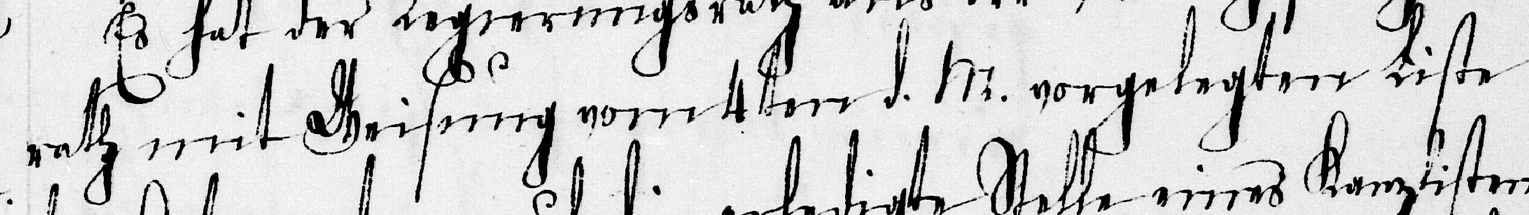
rath mit Weisung vom 4ten d. M. vorgelegten Liste
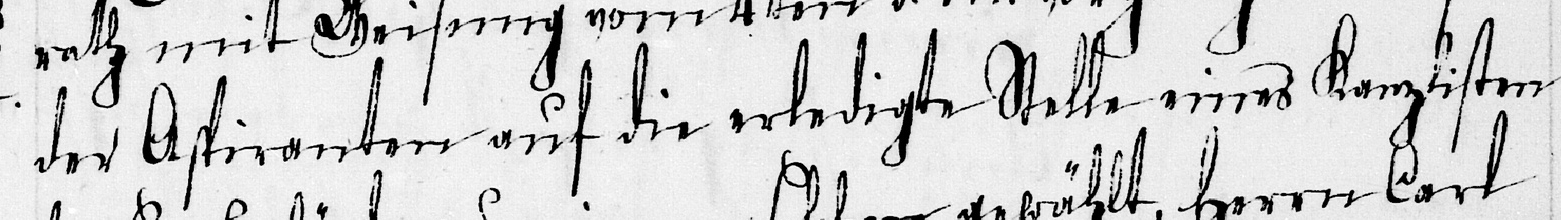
der Aspiranten auf die erledigte Stelle eines Kanzlisten
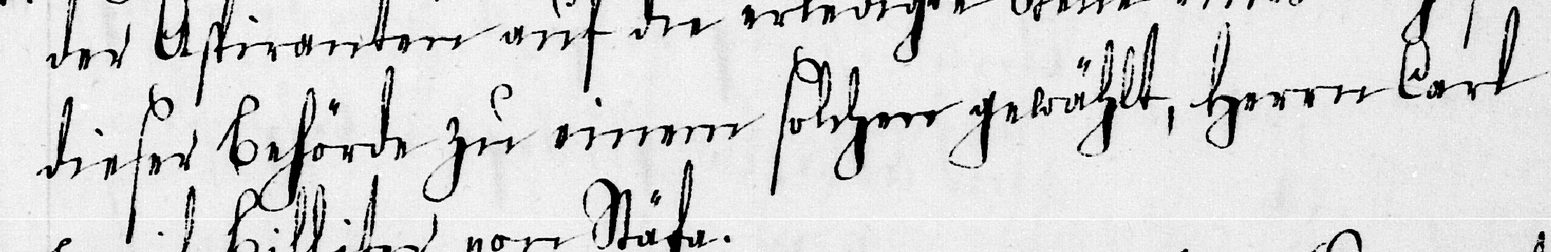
dieser Behörde zu einem solchen gewählt, Herrn Carl
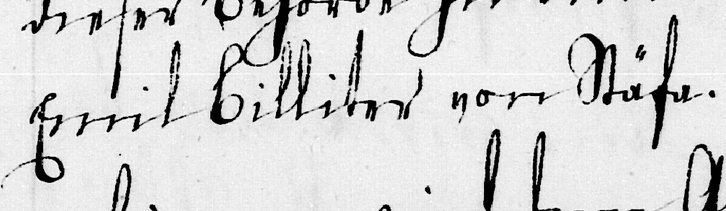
Emil Billiter von Stäfa.
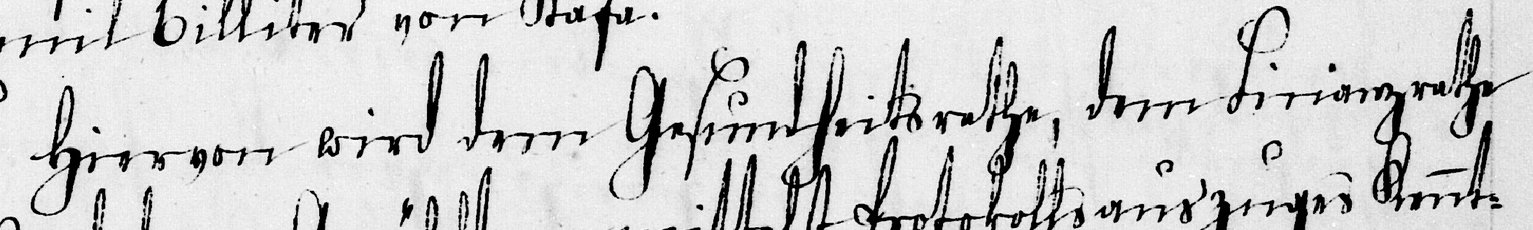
Hiervon wird dem Gesundheitsrathe, dem Finanzrathe
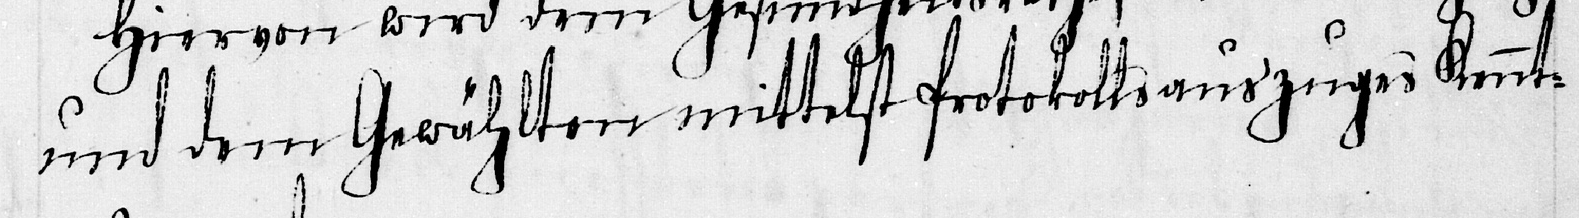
und dem Gewählten mittelst Protokollsauszuges Kennt¬
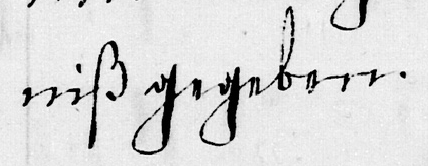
niß gegeben.
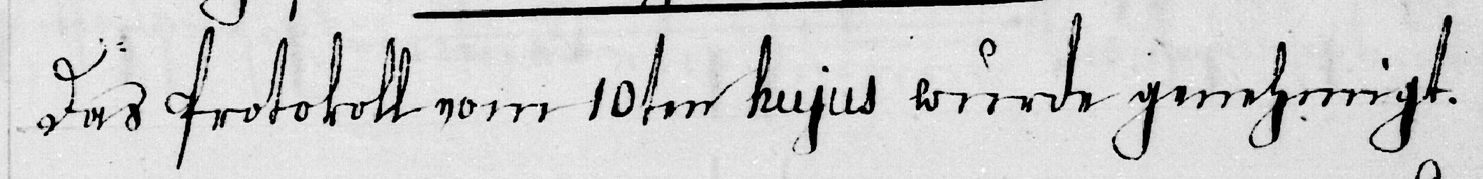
Das Protokoll vom 10ten hujus wurde genehmigt.
